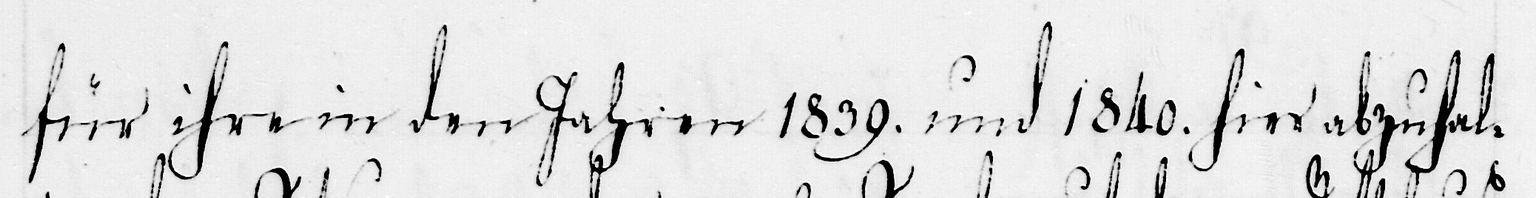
für ihre in den Jahren 1839. und 1840. hier abzuhal¬
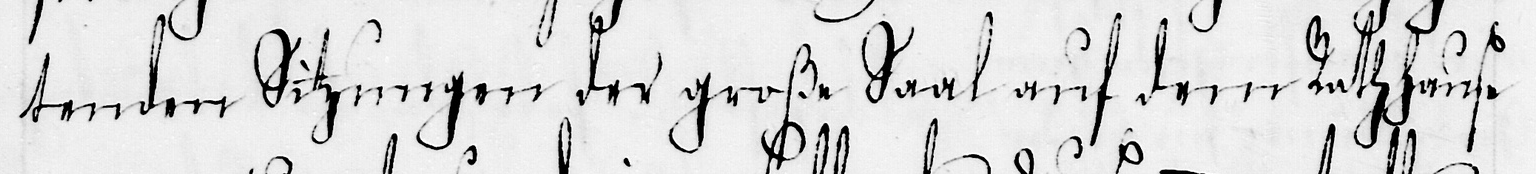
tenden Sitzungen der große Saal auf dem Rathhause
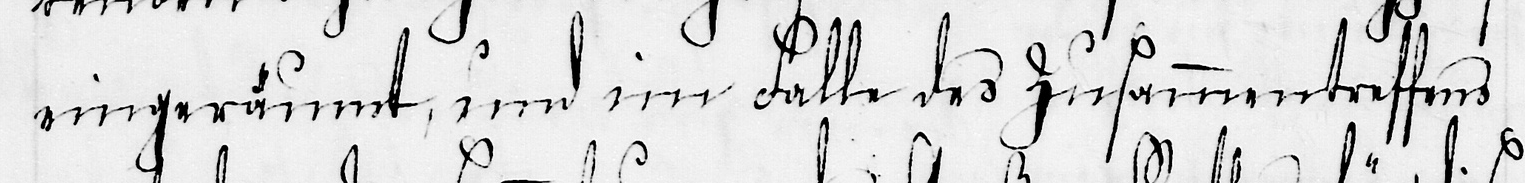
eingeräumt, und im Falle des Zusammentreffens
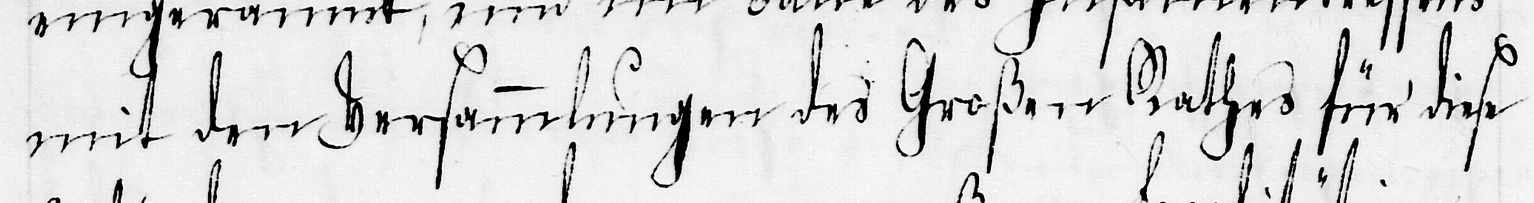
mit den Versammlungen des Großen Rathes für diese
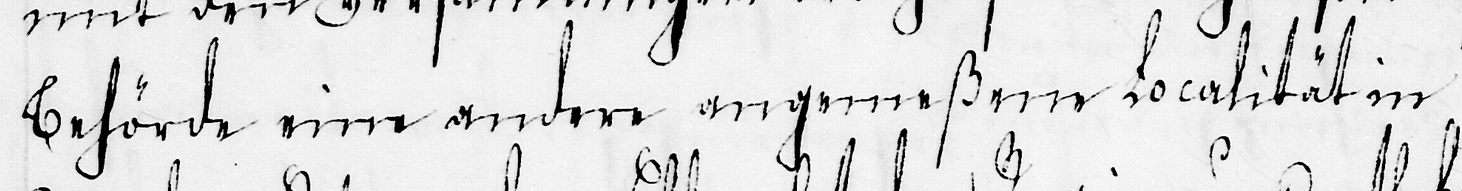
Behörde eine andere angemeßene Localität in
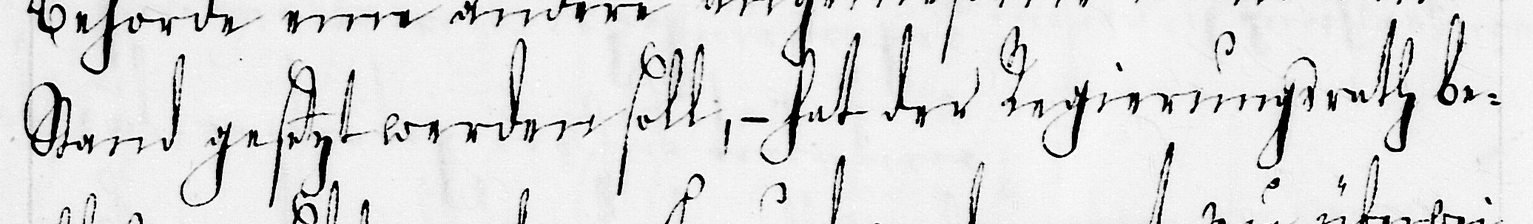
Stand gesetzt werden soll, – hat der Regierungsrath be¬
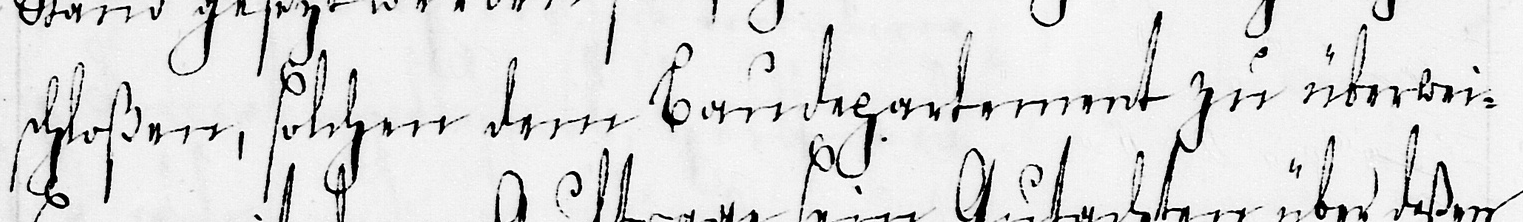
schloßen, solchen dem Baudepartement zu überwei¬
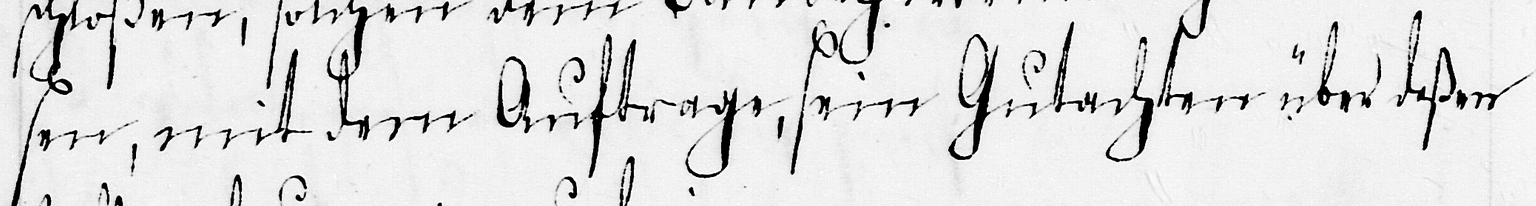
sen, mit dem Auftrage, sein Gutachten über deßen
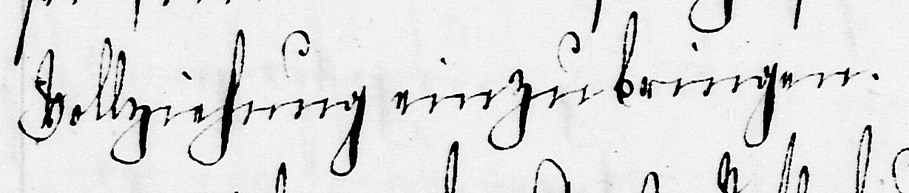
Vollziehung einzubringen.
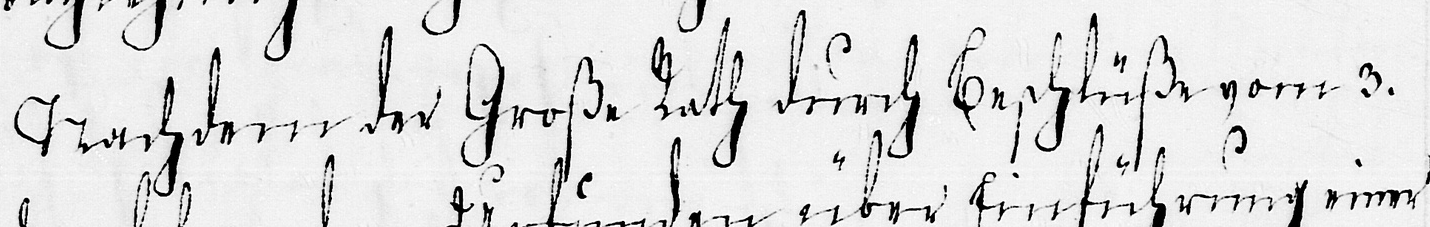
Nachdem der Große Rath durch Beschlüße vom 3.
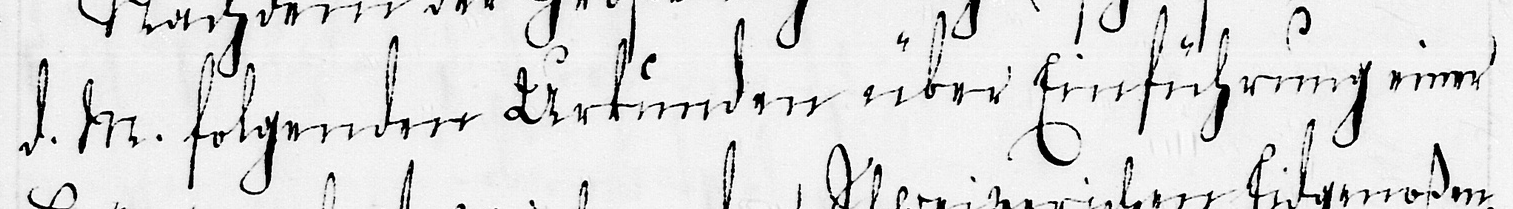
d. M. folgenden Urkunden über Einführung einer
